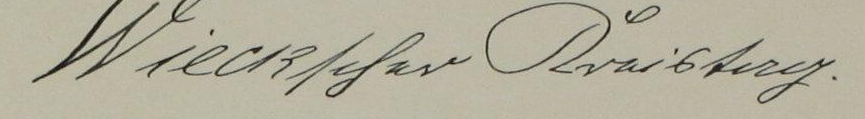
Wieckscher Kreistag.
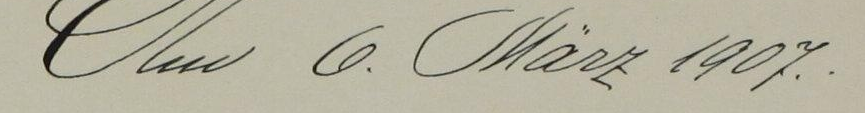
Am 6. März 1907.
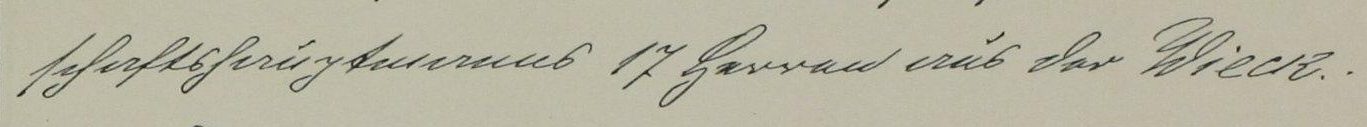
schaftshauptmanns 17 Herren aus der Wieck.
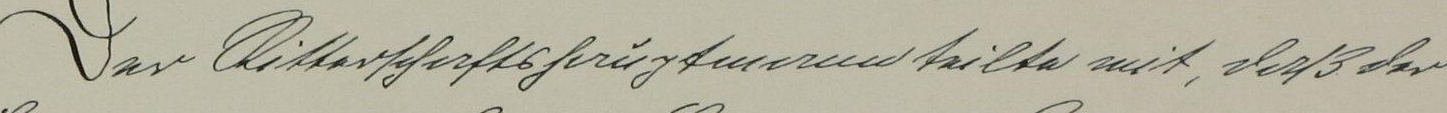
Der Ritterschaftshauptmann teilte mit, daß der
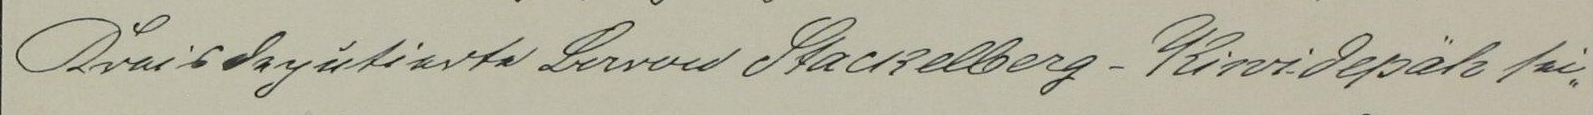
Kreisdeputierte Baron Stackelberg-Kiwidepäh sei-
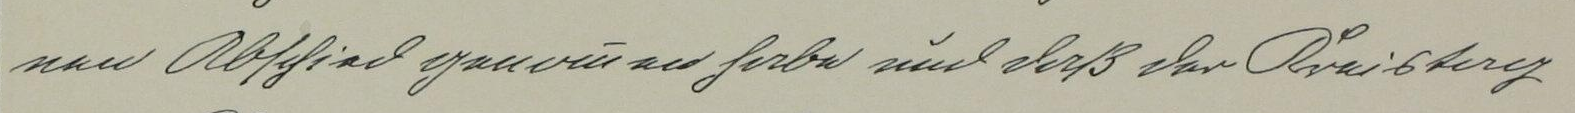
nen Abschied genommen habe und daß der Kreistag
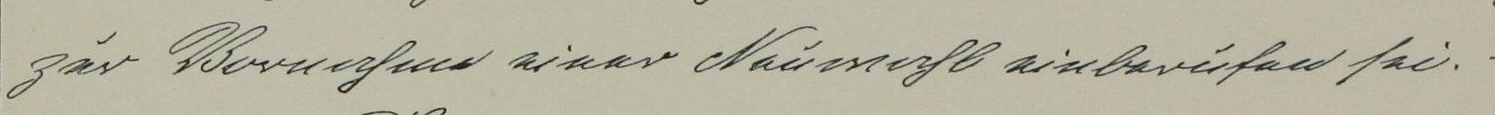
zur Vornahme einer Neuwahl einberufen sei.
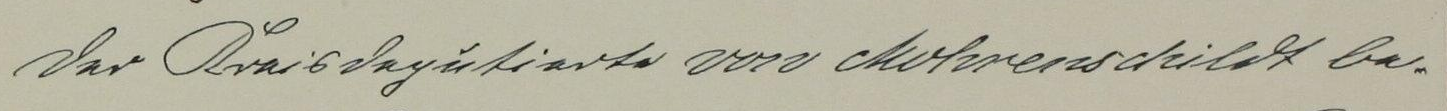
Der Kreisdeputierte von Mohrenschildt be-
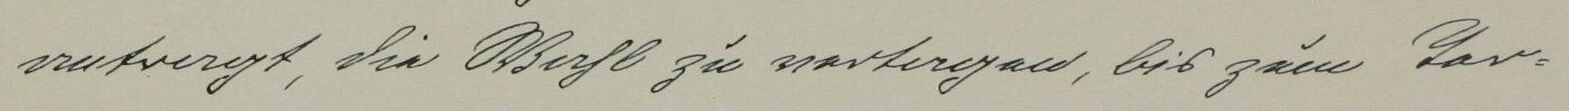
antragt, die Wahl zu vertagen, bis zum Ter-
